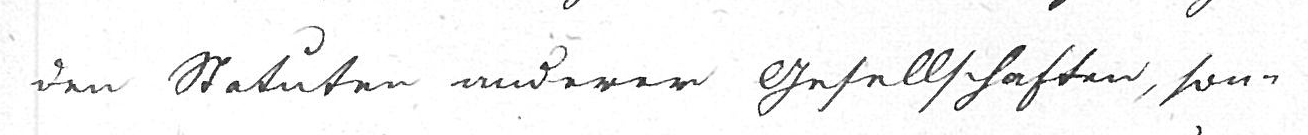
den Statuen anderer Gesellschaften, son-
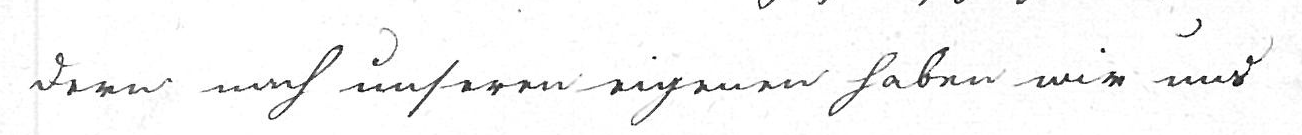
dern nach unseren eigenen haben wir uns
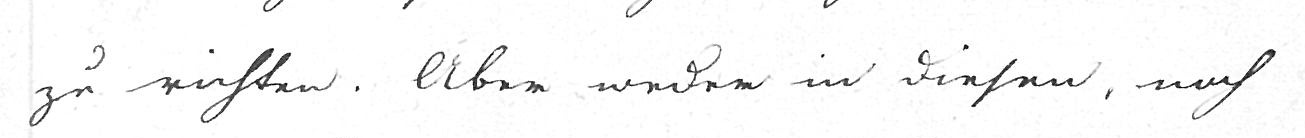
zu richten. Aber werden in diesen, noch
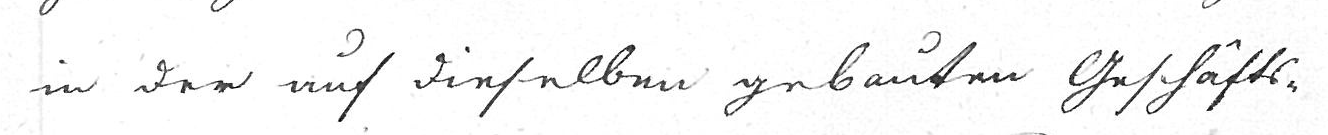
in der auf dieselben gebauten Geschäfts-
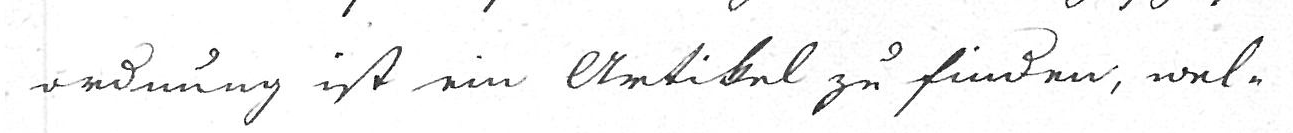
ordnung ist ein Artikel zu finden, wel-
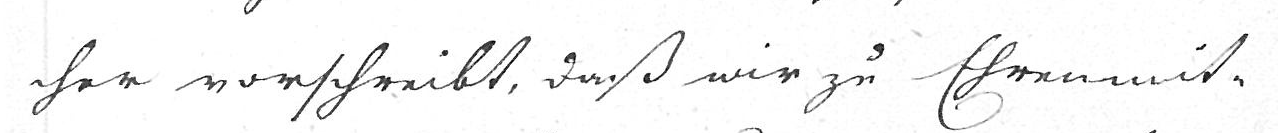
cher vorschreibt, daß wir zu Ehrenmit-
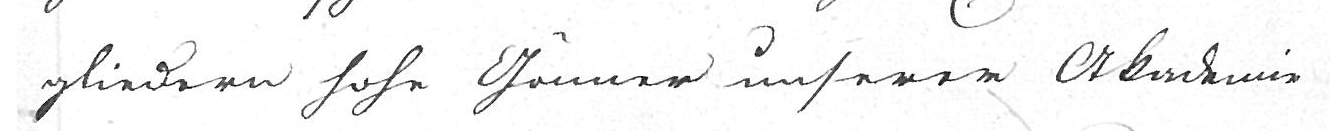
gliedern hohe Gönner unserer Akademie
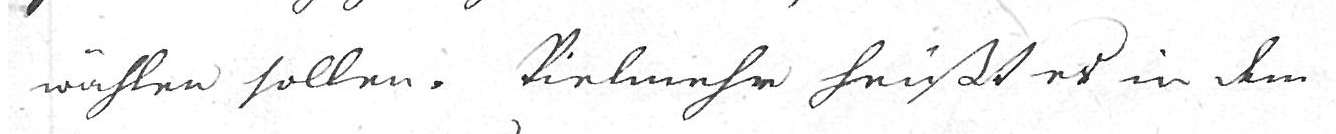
wählen sollen. Vielmehr heißt es in dem
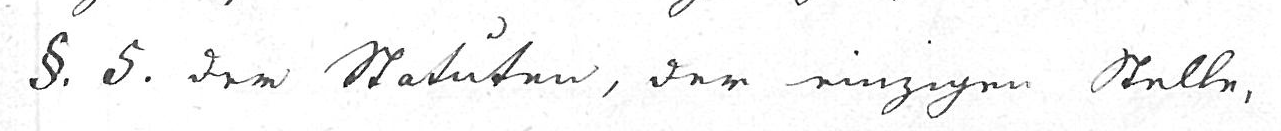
§. 5. der Statuten, der einzigen Stelle,
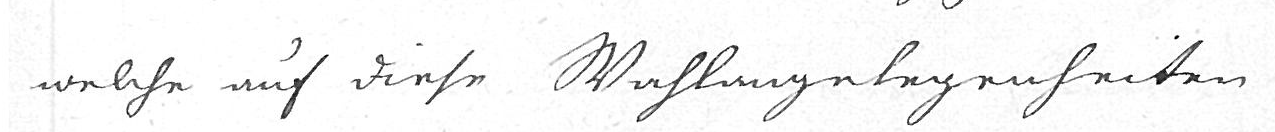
welche auf diese Wahlangelegenheiten
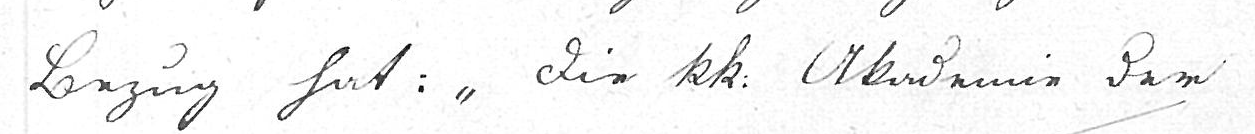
Bezug hat: "Die kk. Akdemie der
